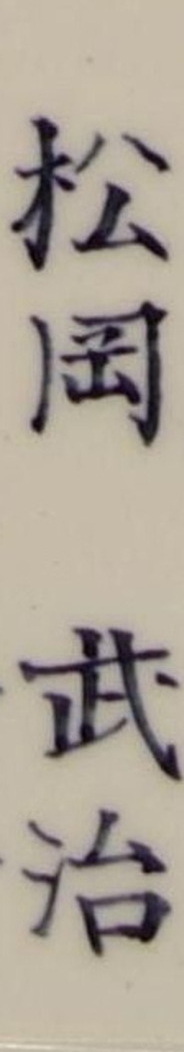松岡武治
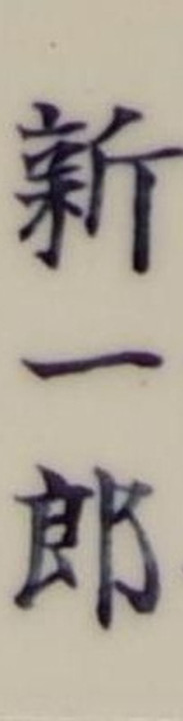新一郎
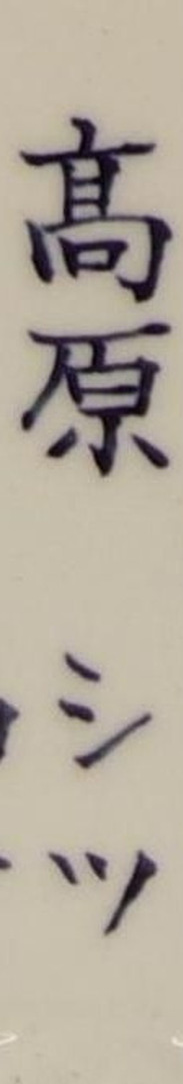高原シツ
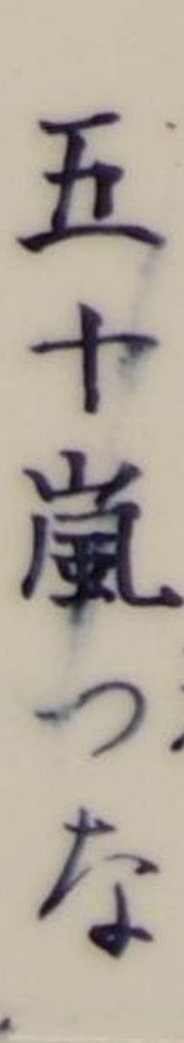五十嵐つな
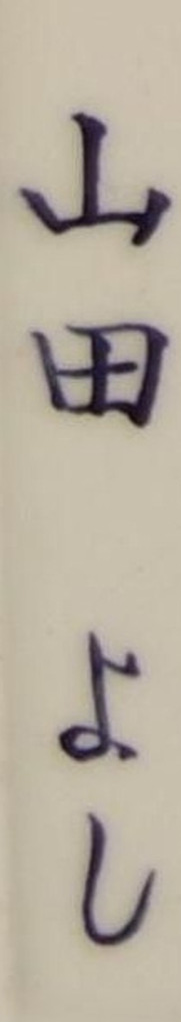山田よし

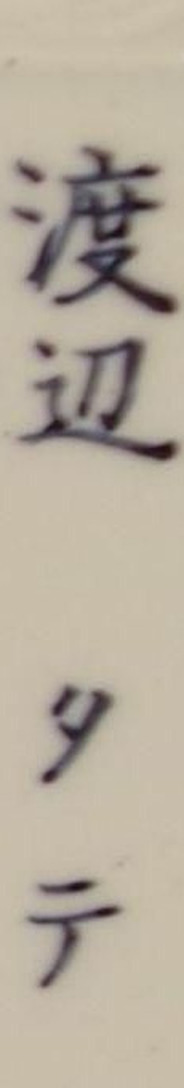渡辺タテ
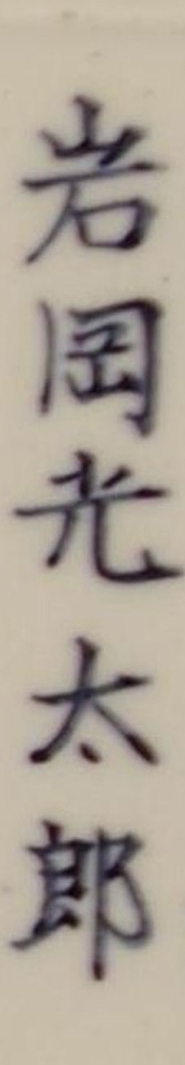岩岡光太郎
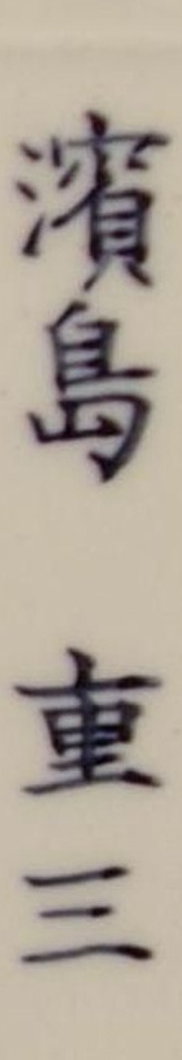濱島重三
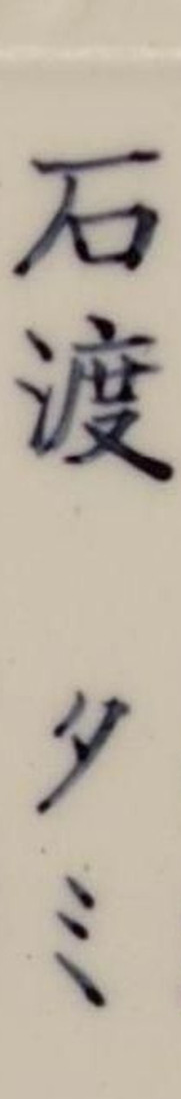石渡タミ
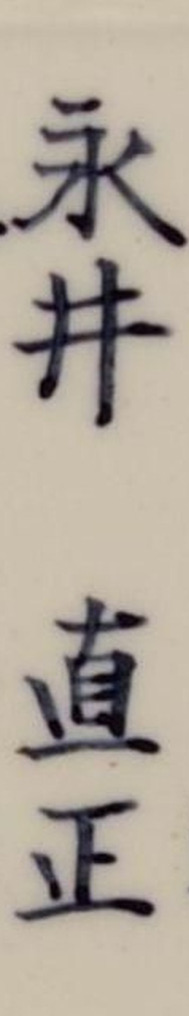永井直正
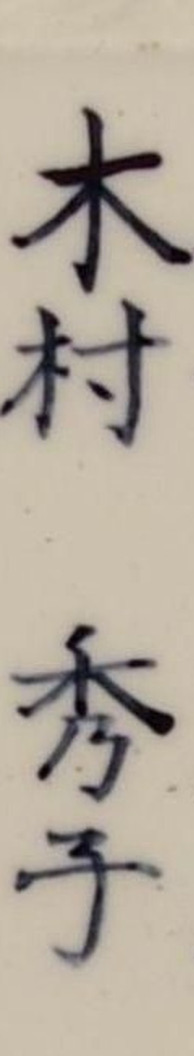木村秀子
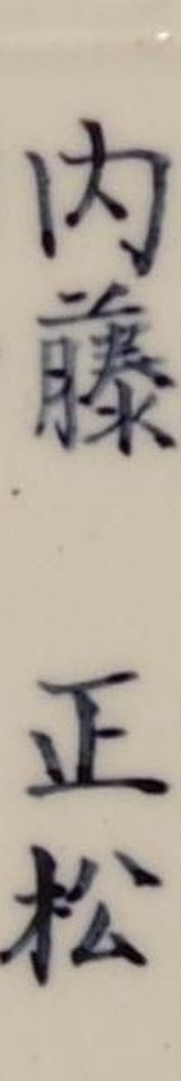内藤正松
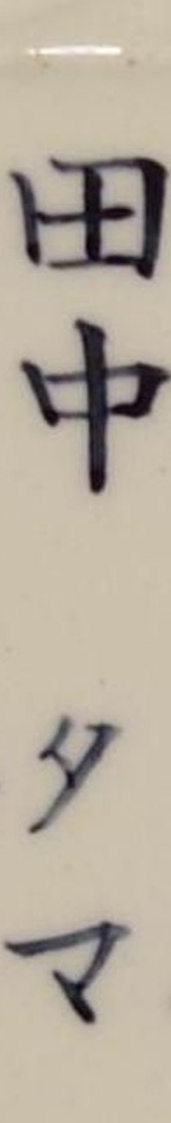田中タマ
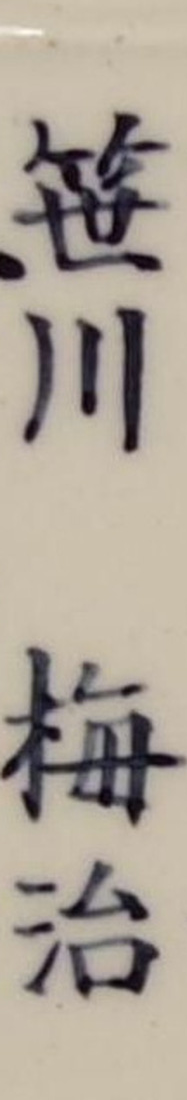笹川梅治
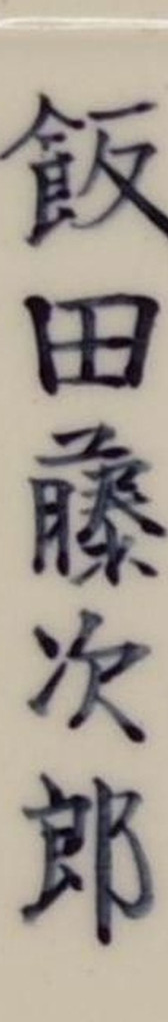飯田藤次郎
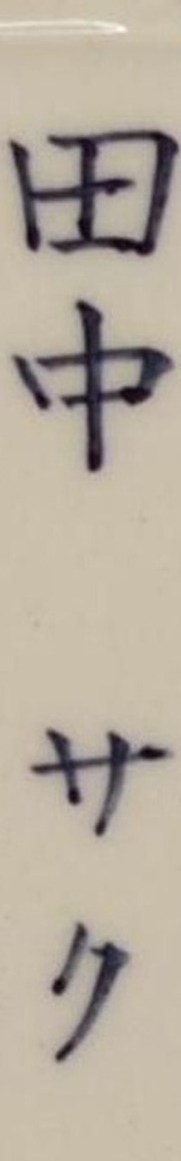田中サク
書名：M~S
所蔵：高野山金剛峯寺
